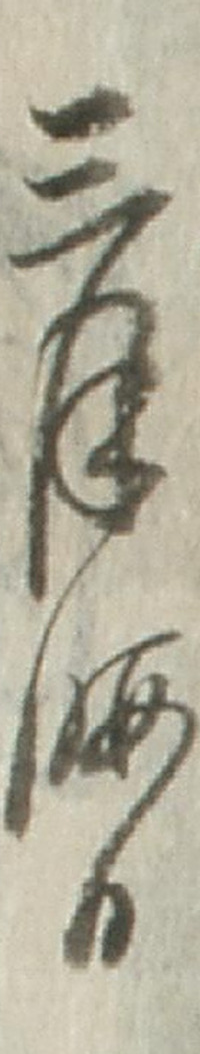三月晦日
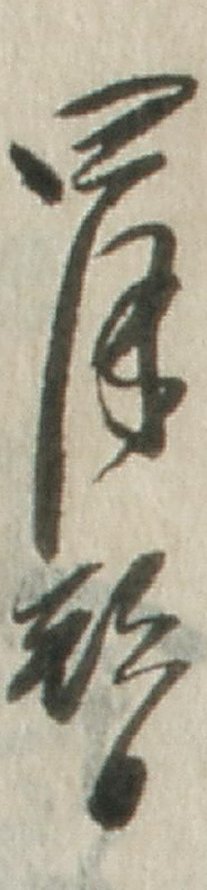四月朔日
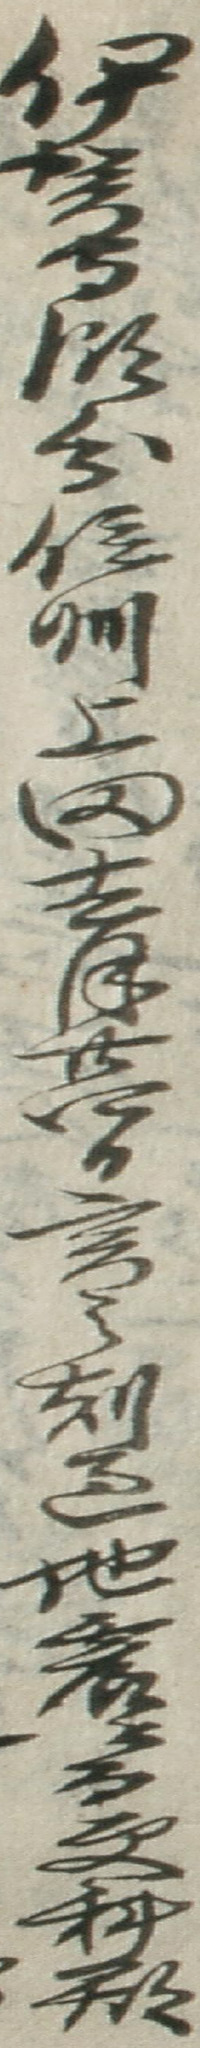伊賀守領分信州上田去月廿四日亥之刻過地震二而更級郡
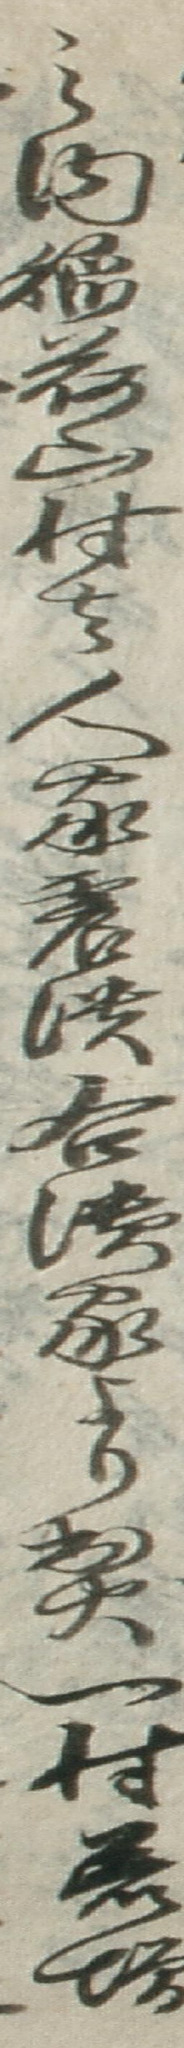之内稲荷山村は人家震潰右潰家より出火一村荒増
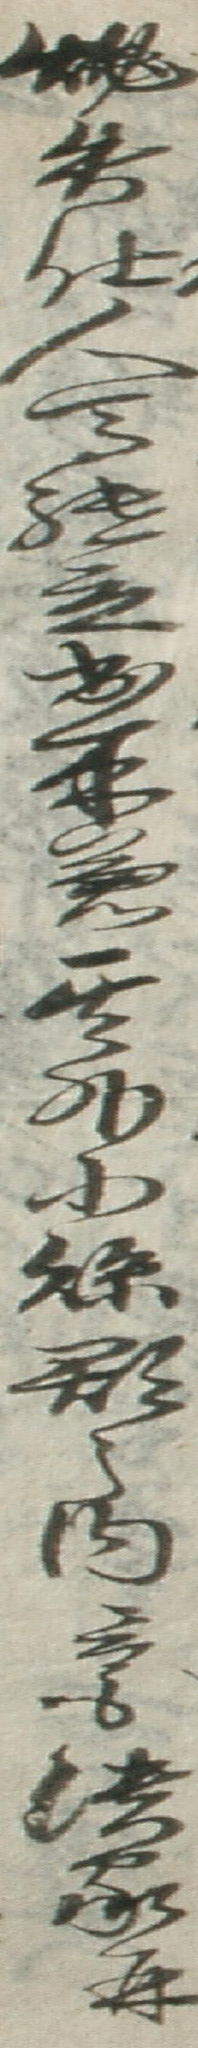焼失仕人馬継立出来兼其外小県郡之内二而も潰家并
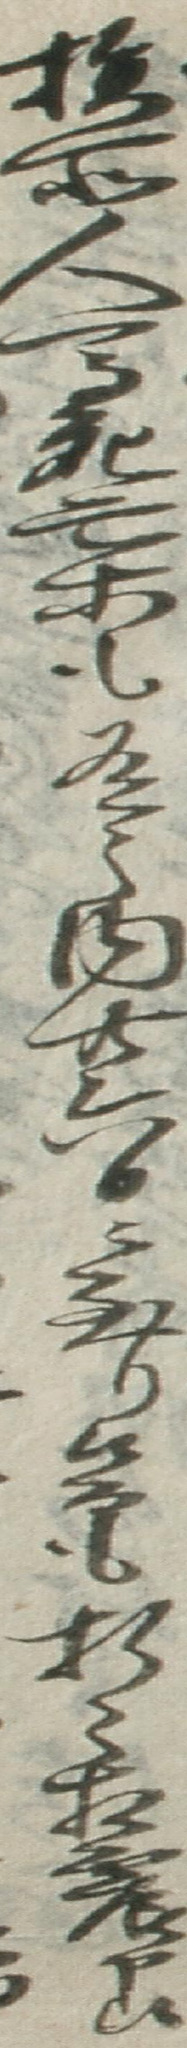損所人馬死亡等も有之内廿六日二至り候而も折々相震申候
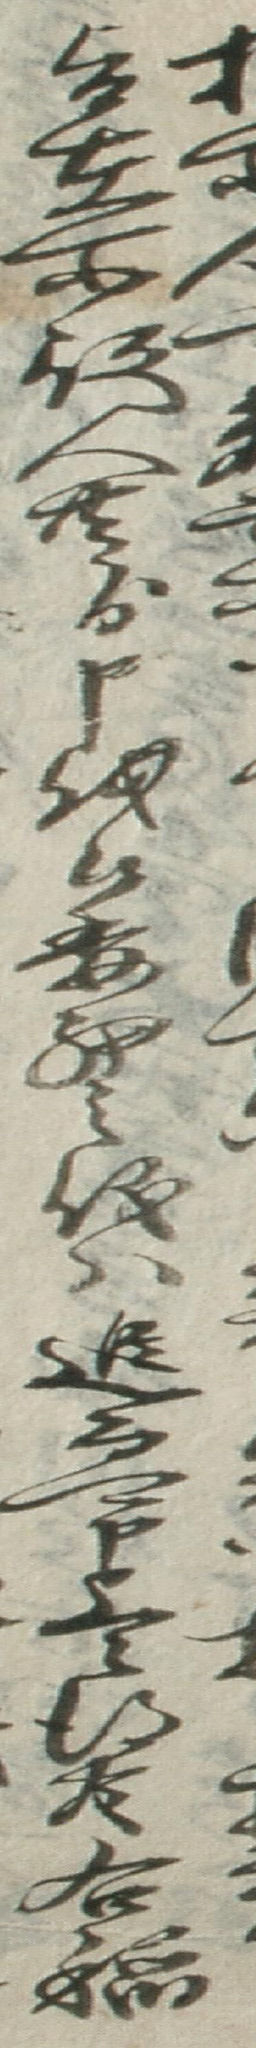在所役人共ゟ申越候委細之儀ハ追而申上候得共右稲
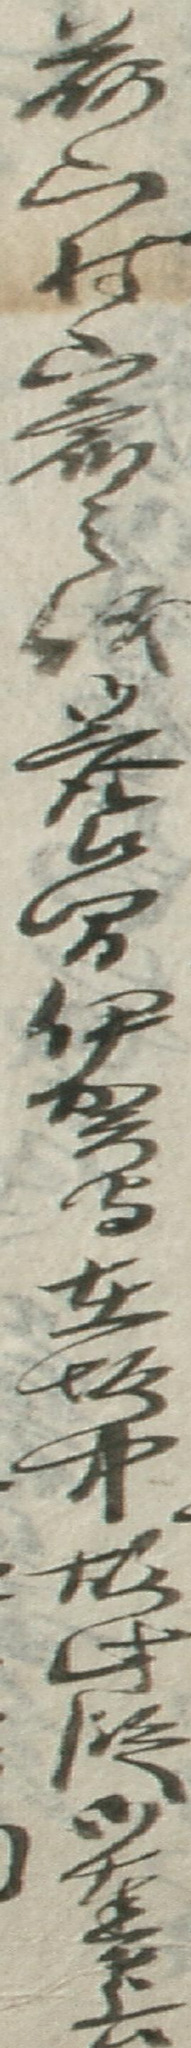荷山村山崩之儀御座候間伊賀守在坂中故此段御達申上候
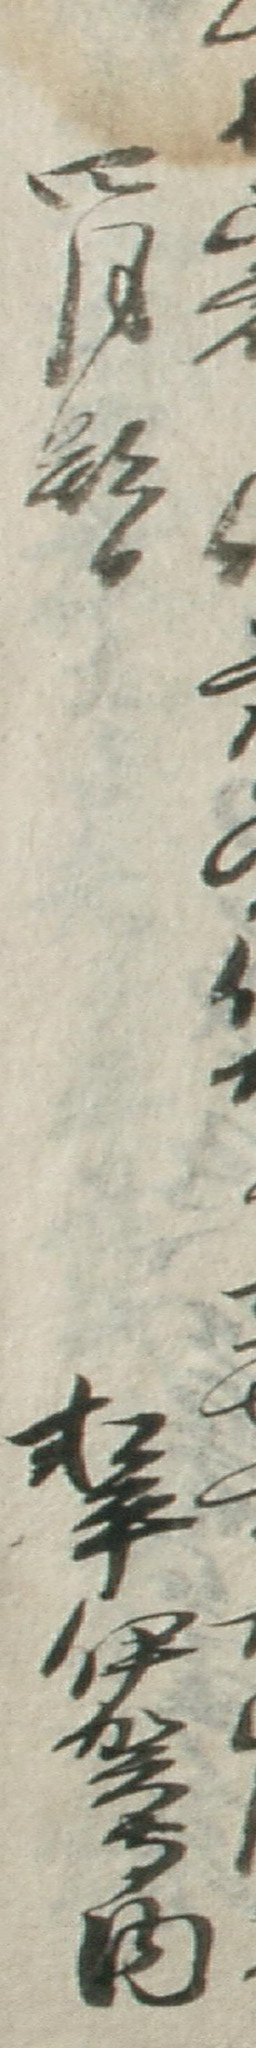四月朔日松平伊賀守内
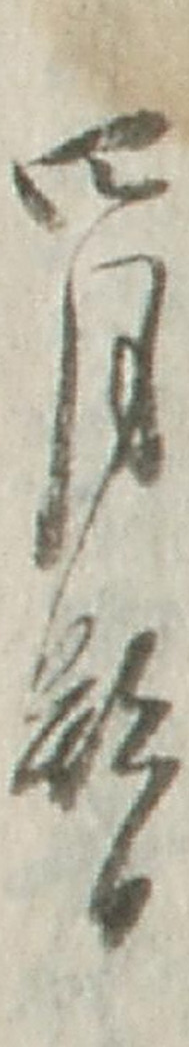四月朔日
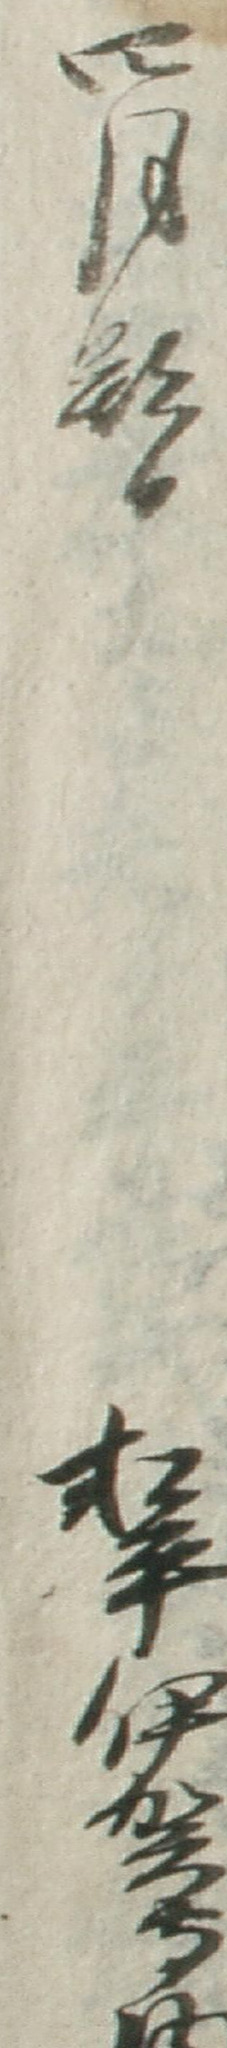四月朔日松平伊賀守内

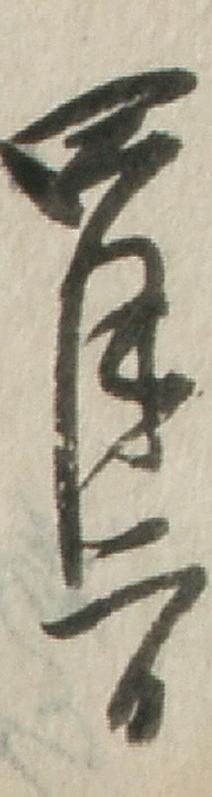四月二日
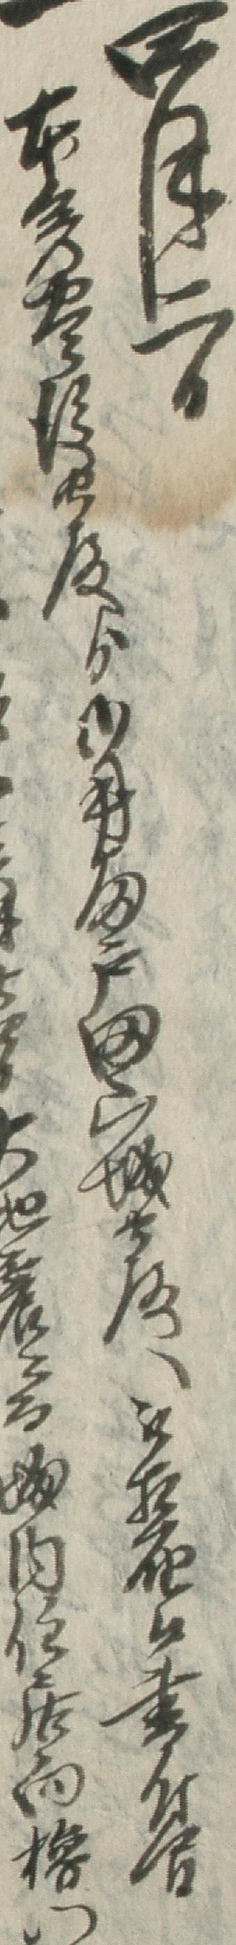一本多豊後守殿ゟ御用番戸田山城守殿へ被相届候書付写
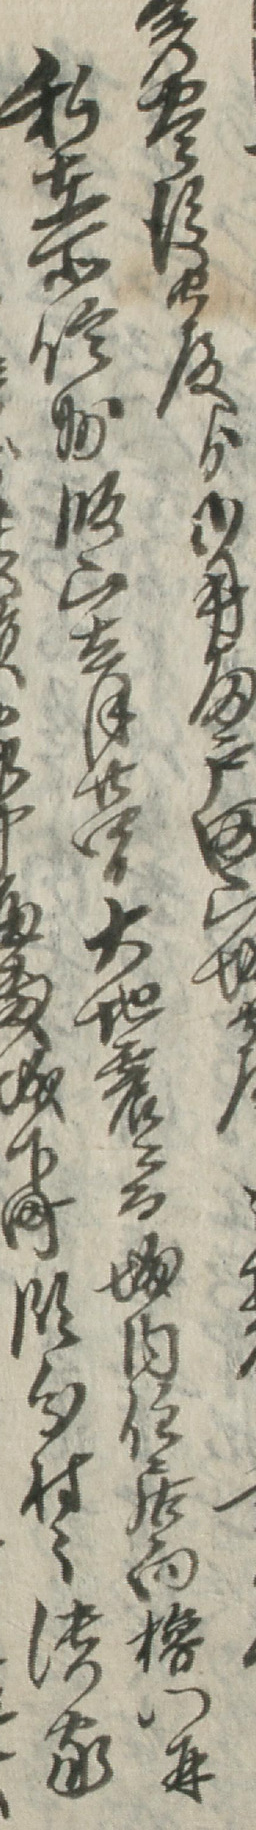私在所信州飯山去月廿四日大地震二而城内住居向櫓門并
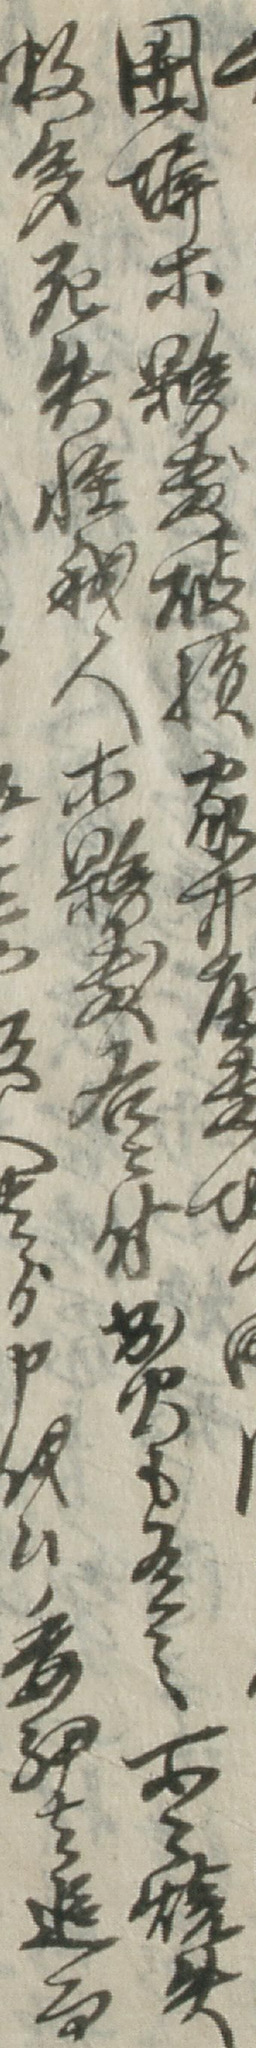数多死失怪我人等夥敷右二付出火も有之所々焼失
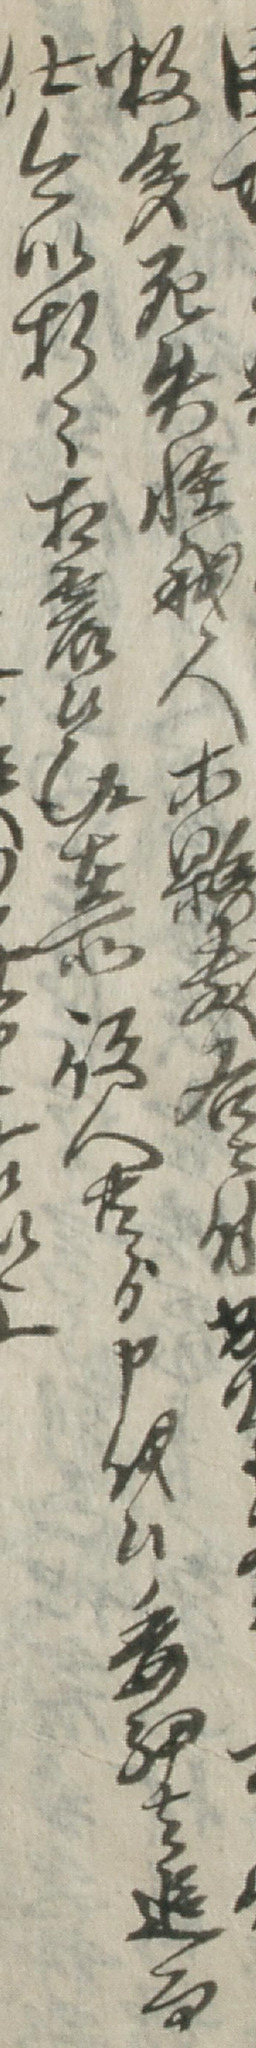仕今以折々相震候趣在所役人共ゟ申越候委細は追而
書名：信濃國地震實録記
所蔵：東京大学地震研究所図書室 Earthquake Research Institute Library, The University of Tokyo, JAPAN
